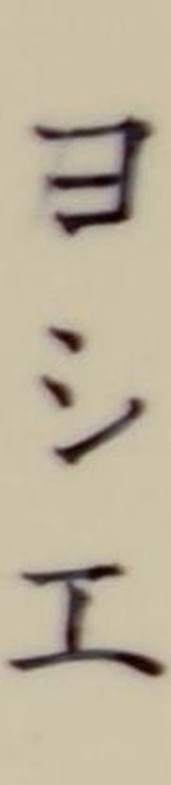ヨシエ
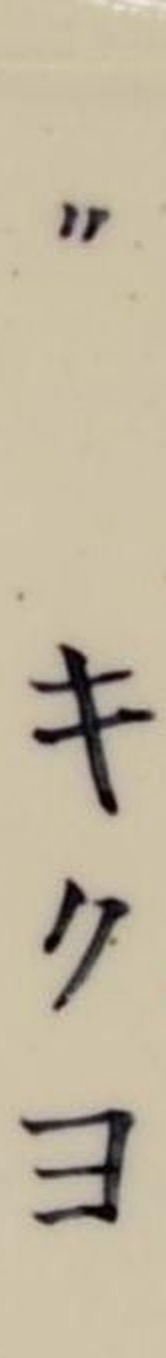キクヨ
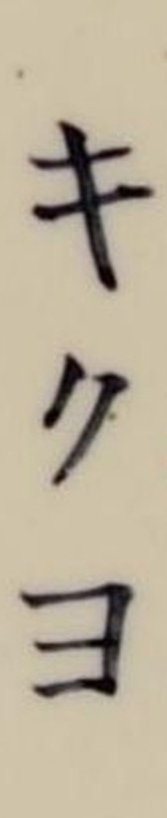キクヨ
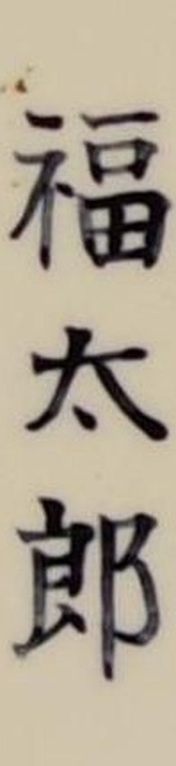福太郎
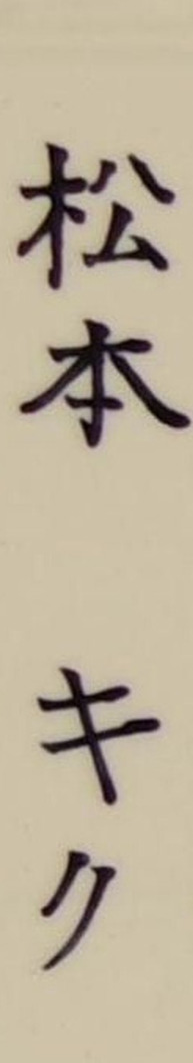松本キク
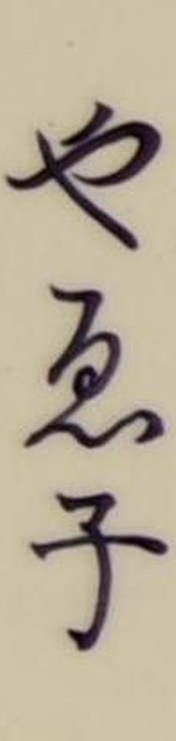やゑ子

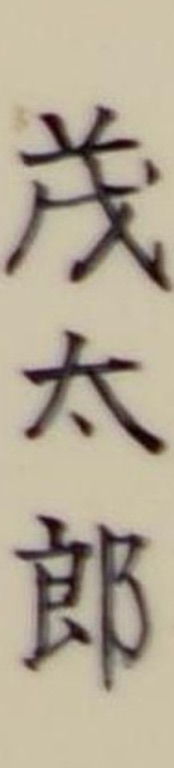茂太郎
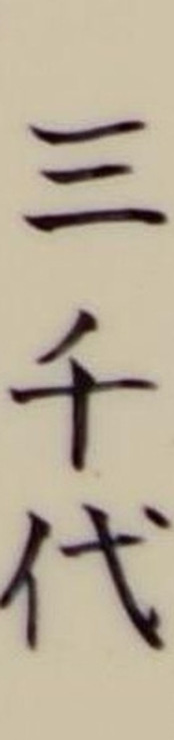三千代
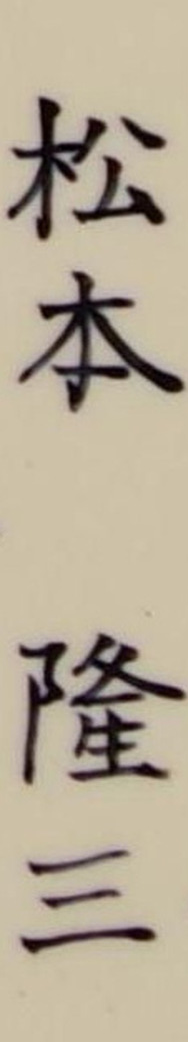松本隆三
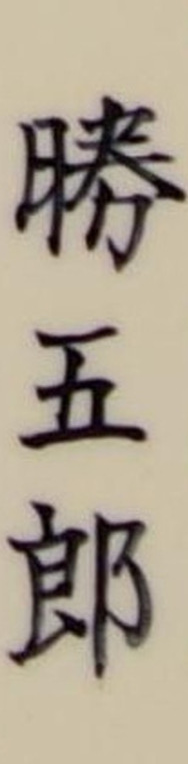勝五郎
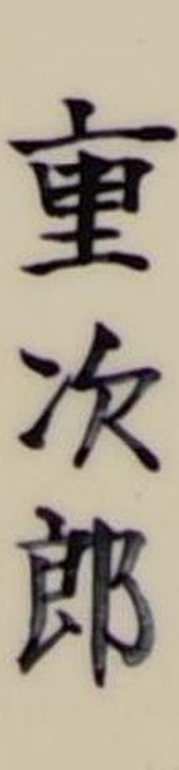重次郎
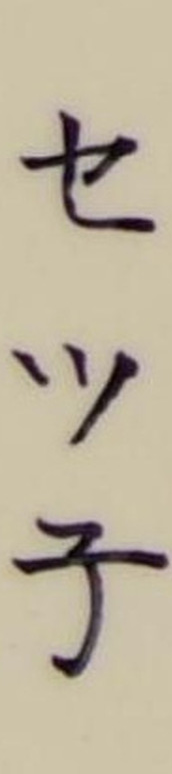セツ子

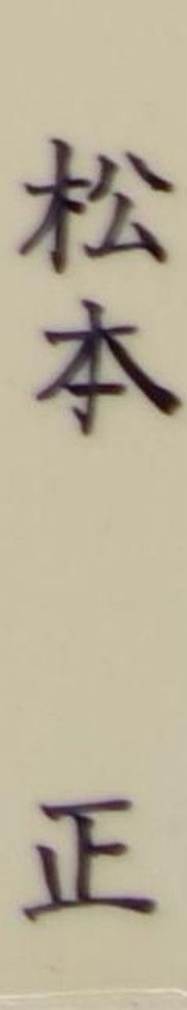松本正
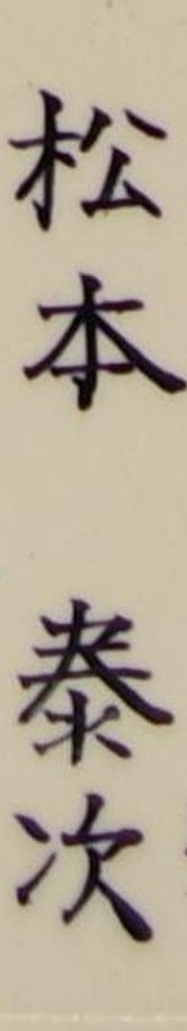松本泰次
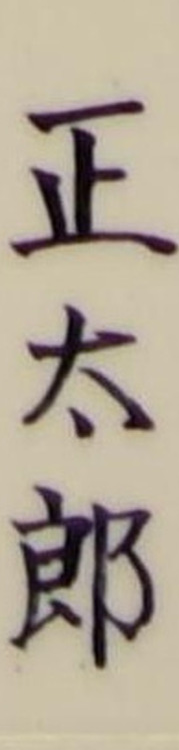正太郎
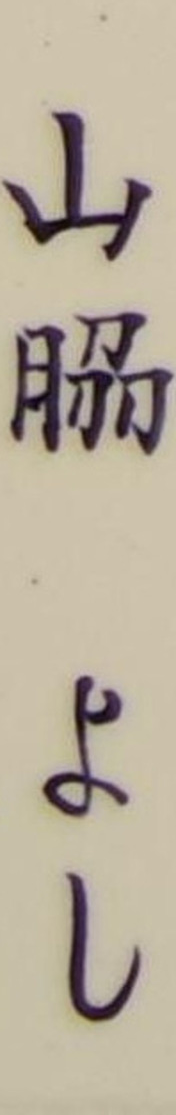山脇よし
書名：A~D
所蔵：koyasan kongobuji
